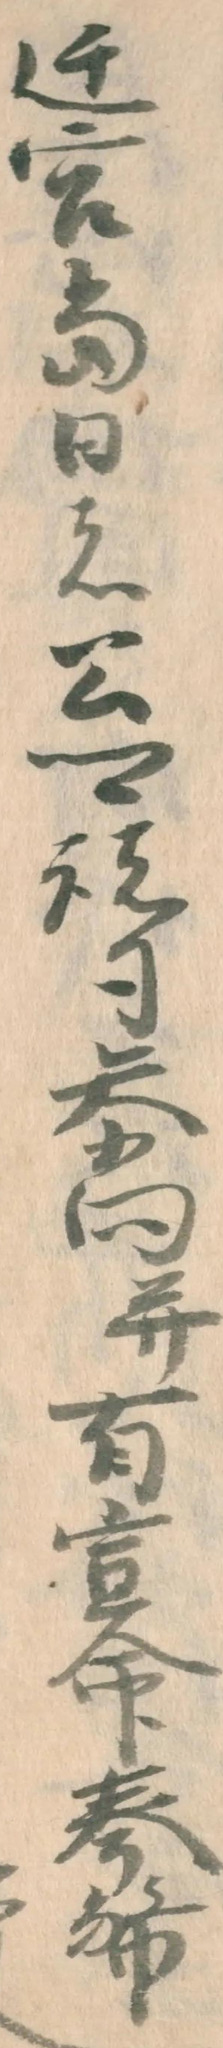遷宮当日は公卿諸司参向并有宣命奉幣等也
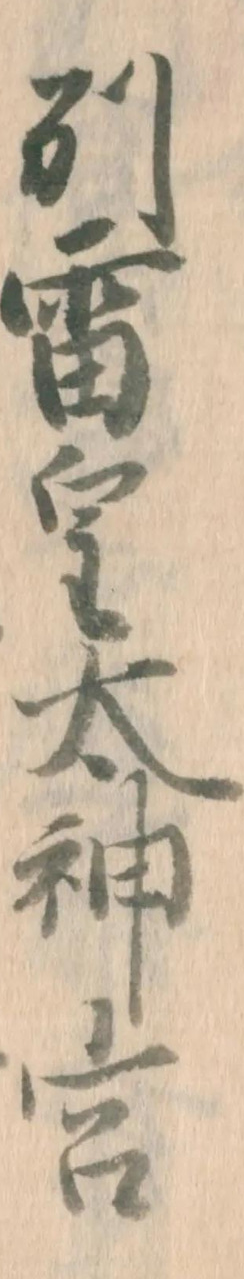別雷皇太神宮
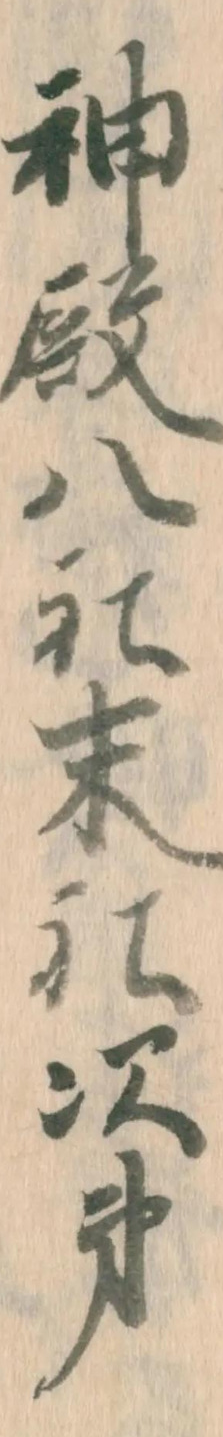神殿八社末社次第

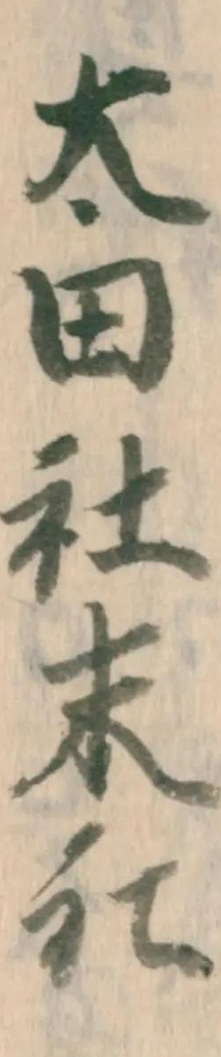太田社末社
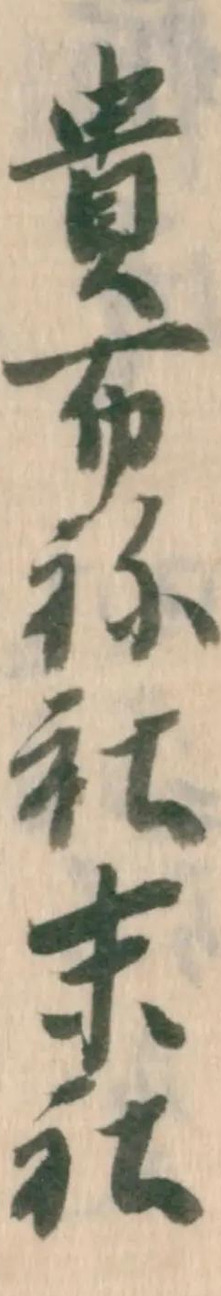貴ふね社末社

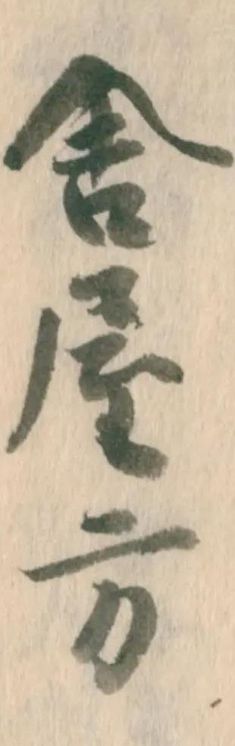舎屋方

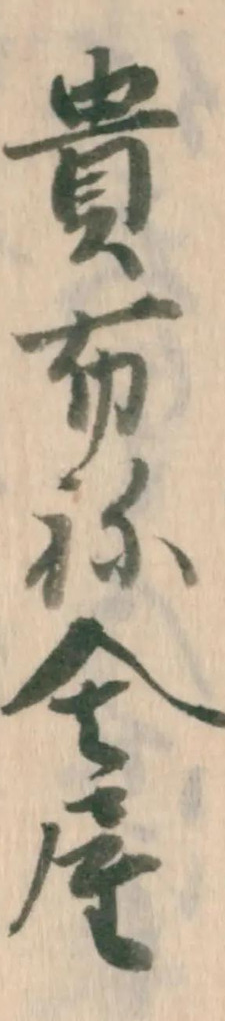貴ふね舎屋

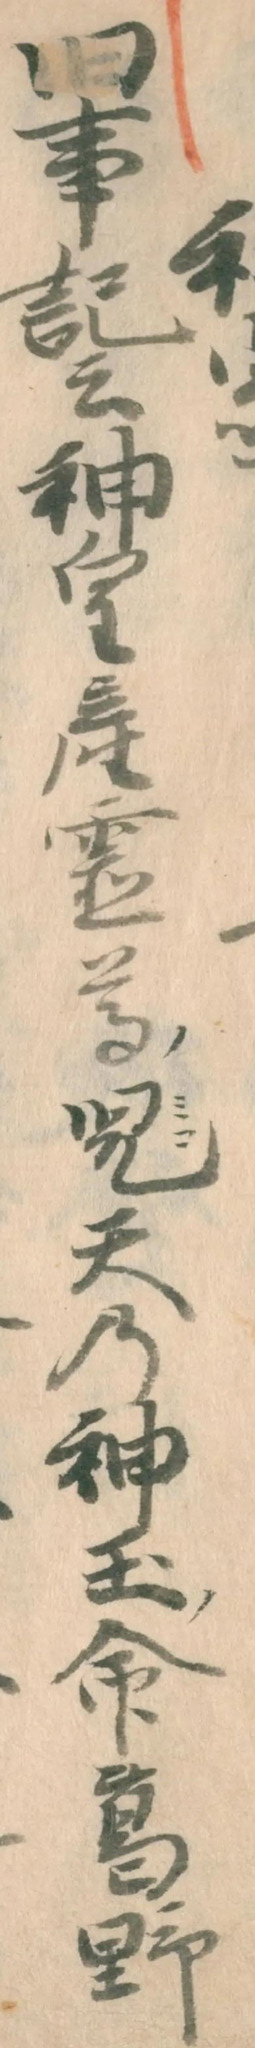旧事記云神皇産霊尊児天の神玉命葛野
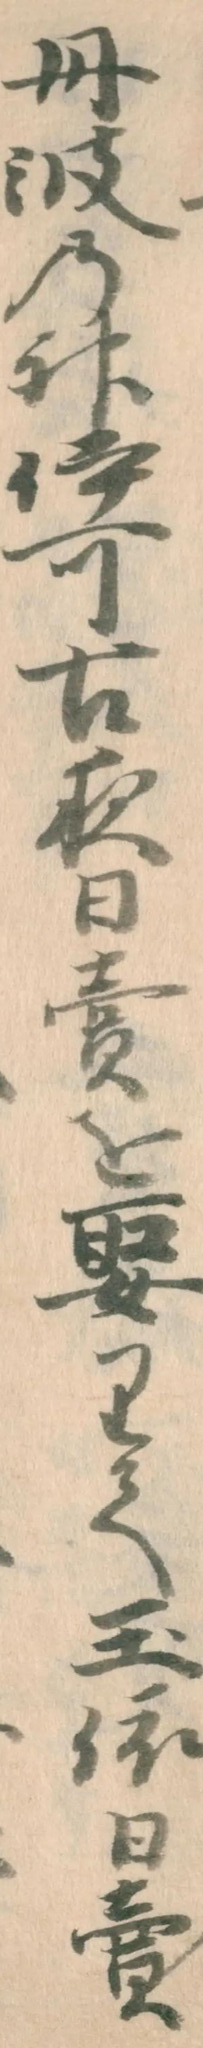丹波の神伊可古夜日売を娶りて玉依日売
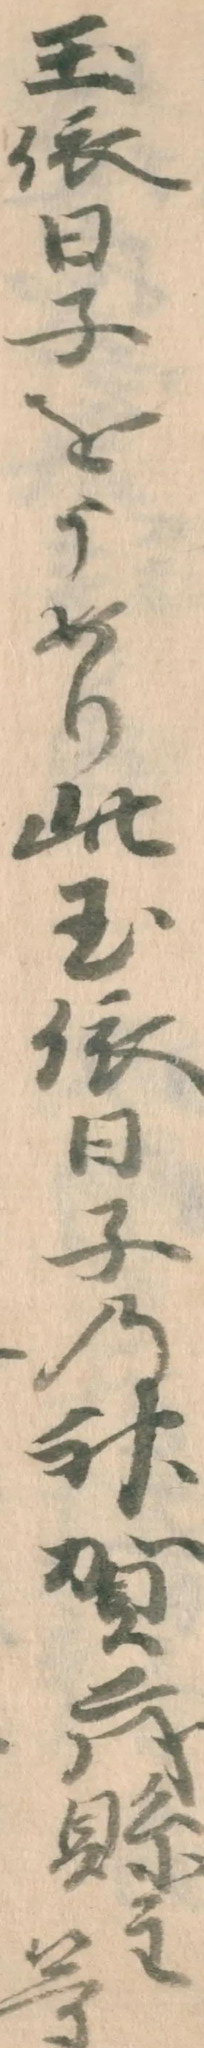玉依日子をうめり此玉依日子の神賀茂県主等
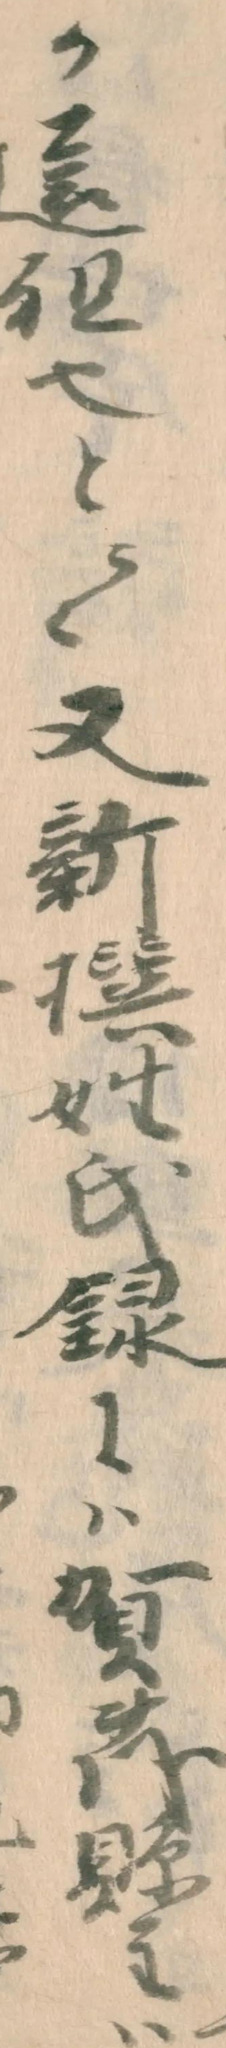か遠祖也と云々又新撰姓氏録には賀茂県主は
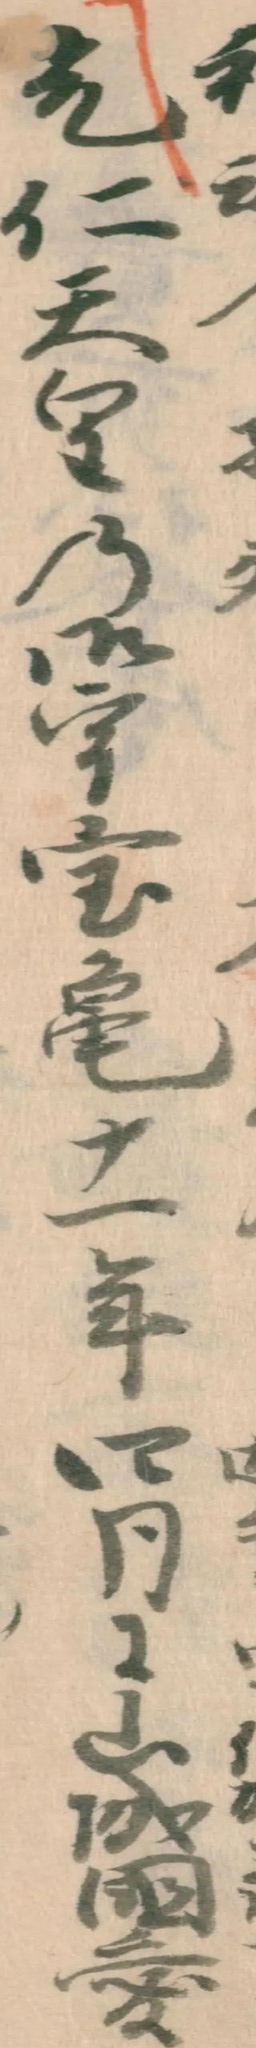光仁天皇の御宇宝亀十一年四月に山城国愛
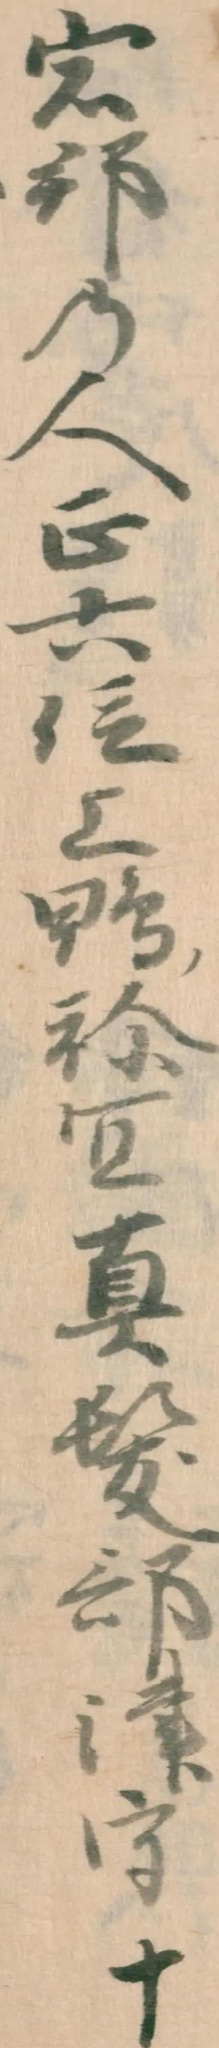宕邦の人正六位上鴨祢宜真髪部津守十
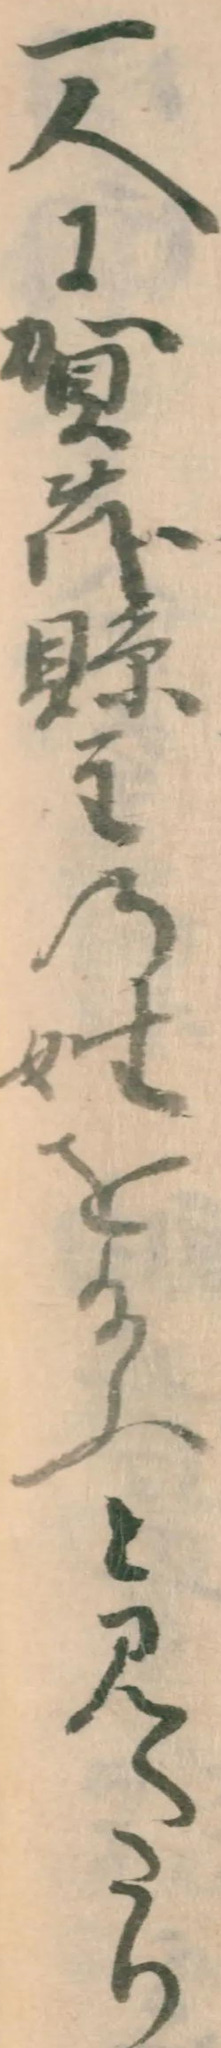一人に賀茂県主の姓を給ふと見えたり
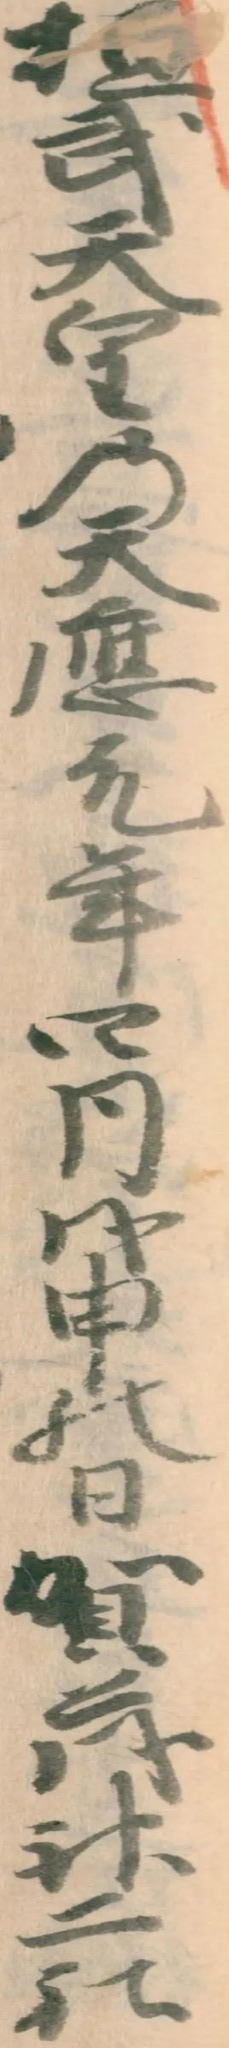桓武天皇の天応元年四月戊申の日賀茂神二社
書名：賀茂社記録. 第1冊
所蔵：国立国会図書館 National Diet Library, JAPAN
